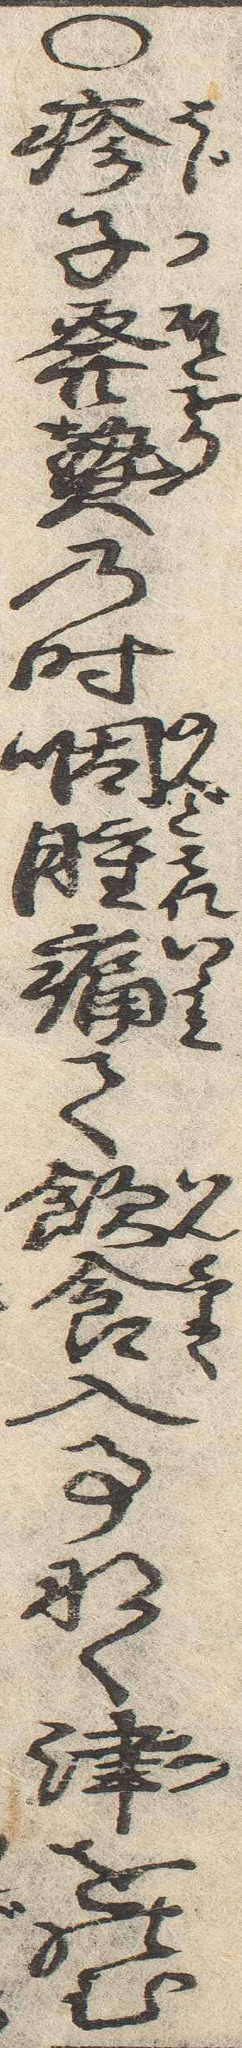○疹子発熱の時咽腫痛て飲食入事なくつをのむ
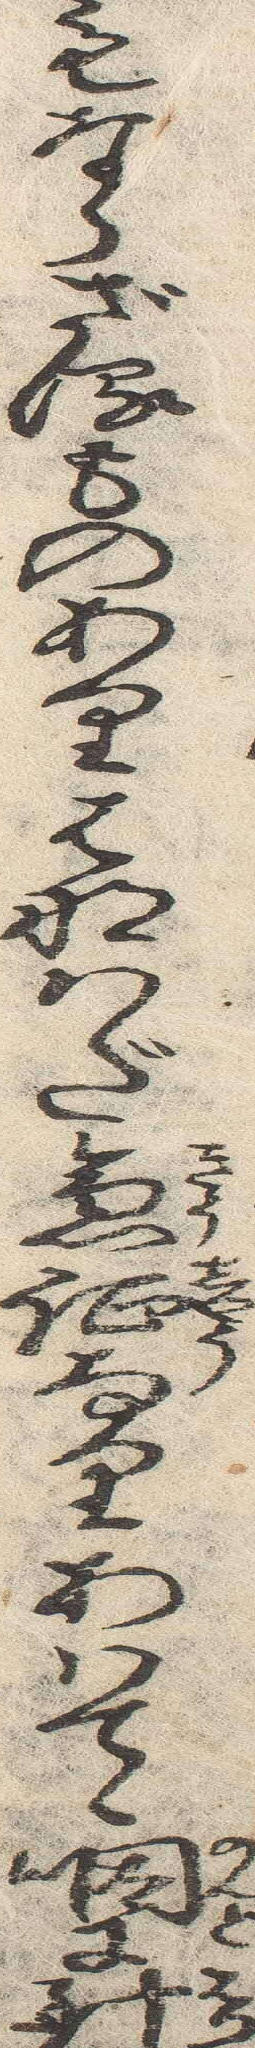もならざるものありはなはだ急証なりあはてゝ咽に針
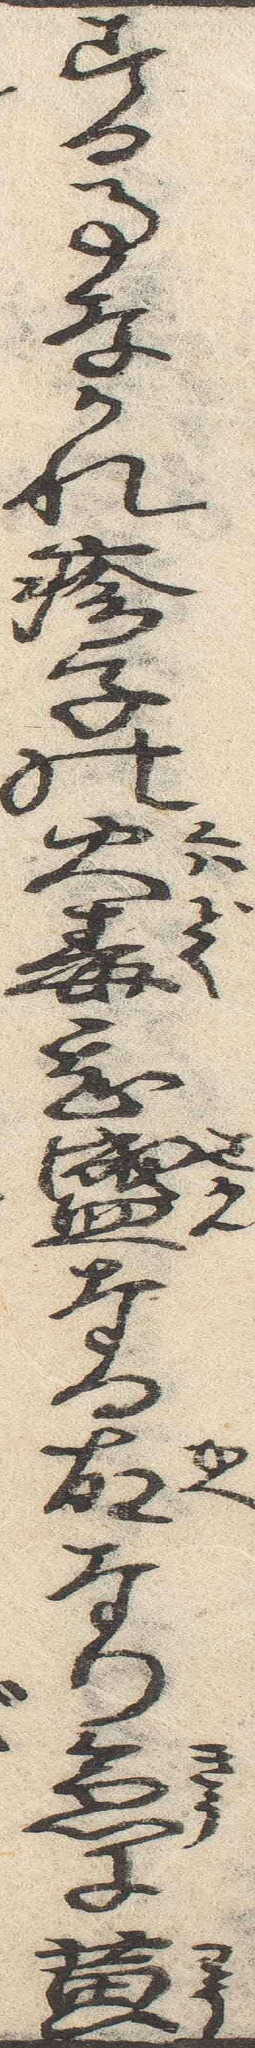する事なかれ疹子の火毒甚盛なる故なり急に黄
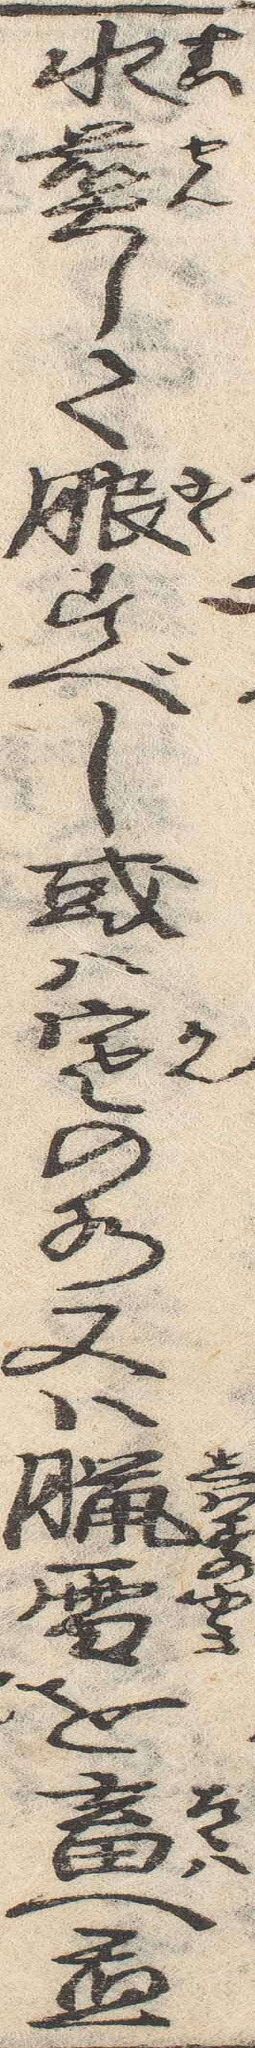水煎して服すべし或は寒の水又は臘雪を畜へ置
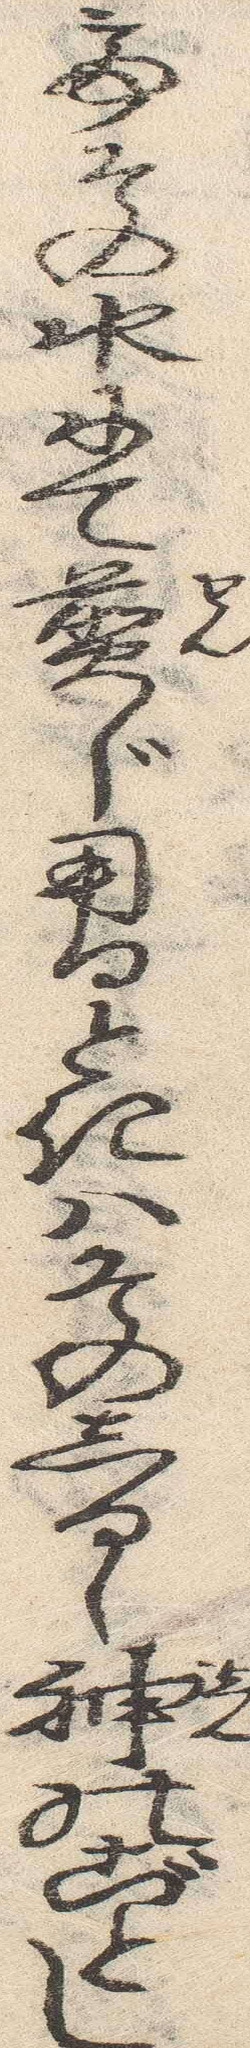てその水にて煎じ用るときはそのしるし神のごとし
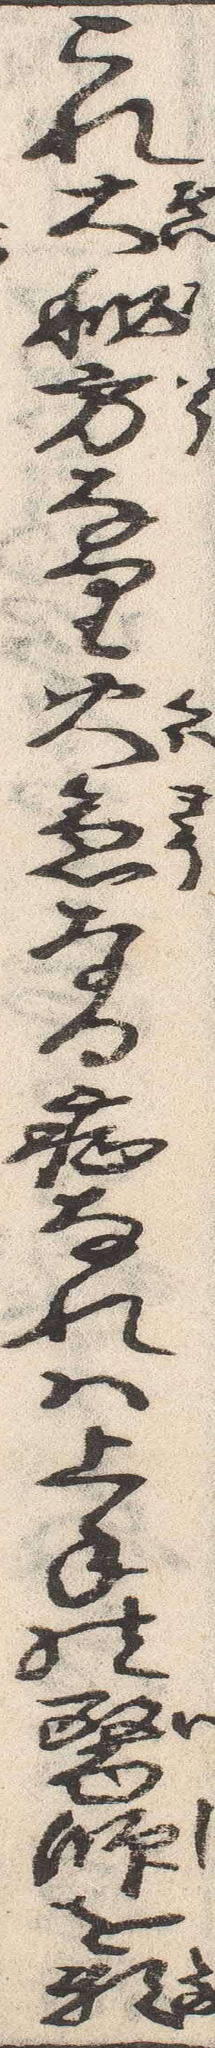これ大秘方なり火急なる症なれは上手の医師を頼
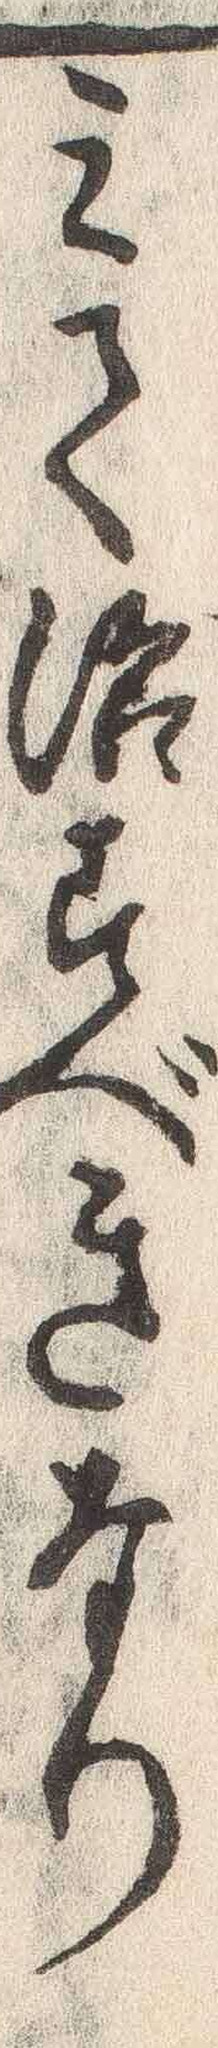みて治すべきなり
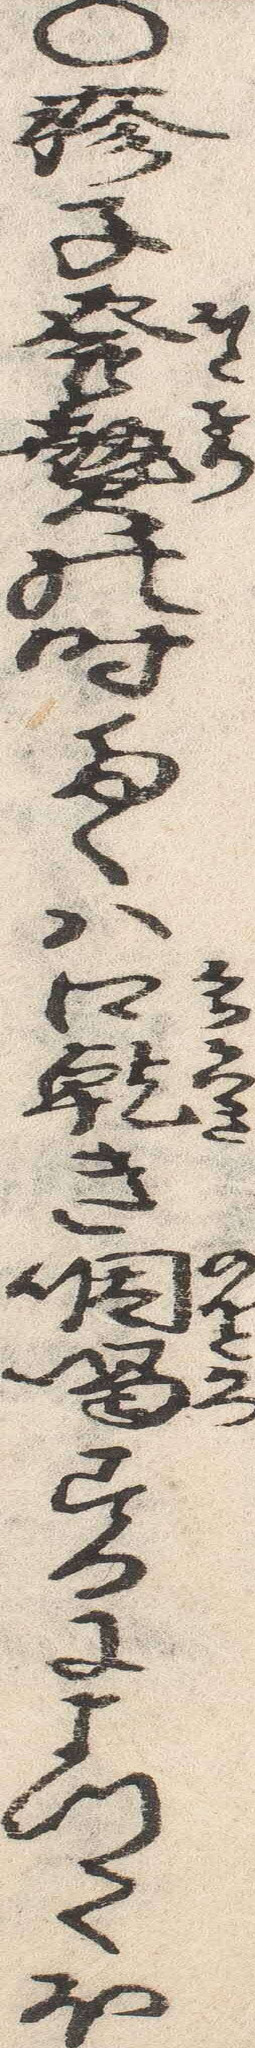○疹子発熱の時多くは口乾き咽喝するによつてほ
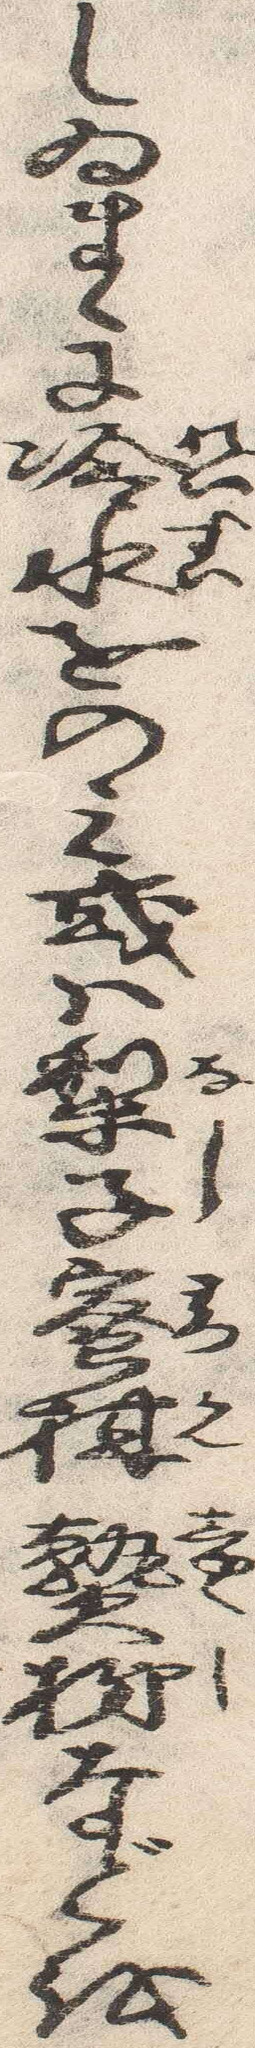しゐまゝに冷水をのみ或は梨子蜜柑熟柿などを
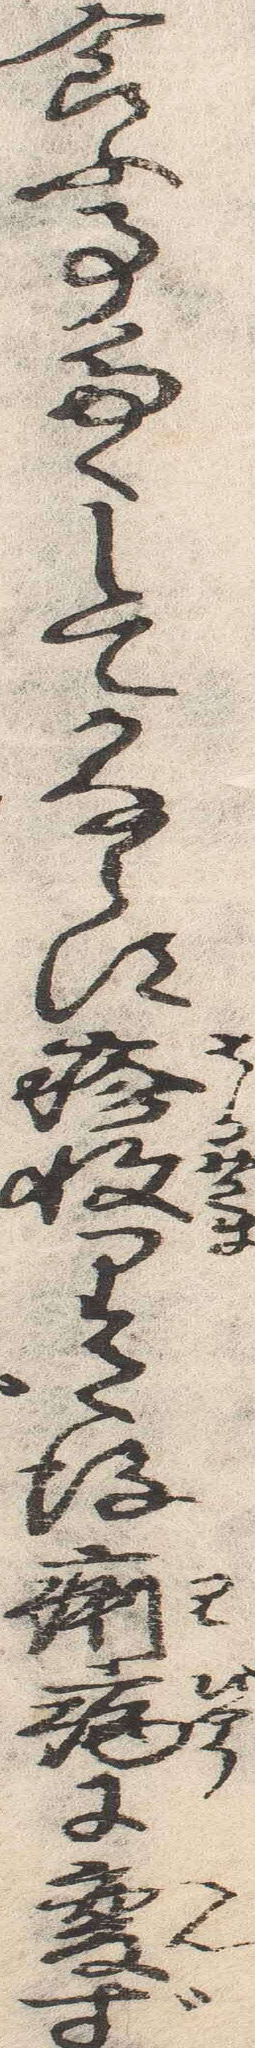食ふ事多くしてかならす疹収りて後痢病に変ず
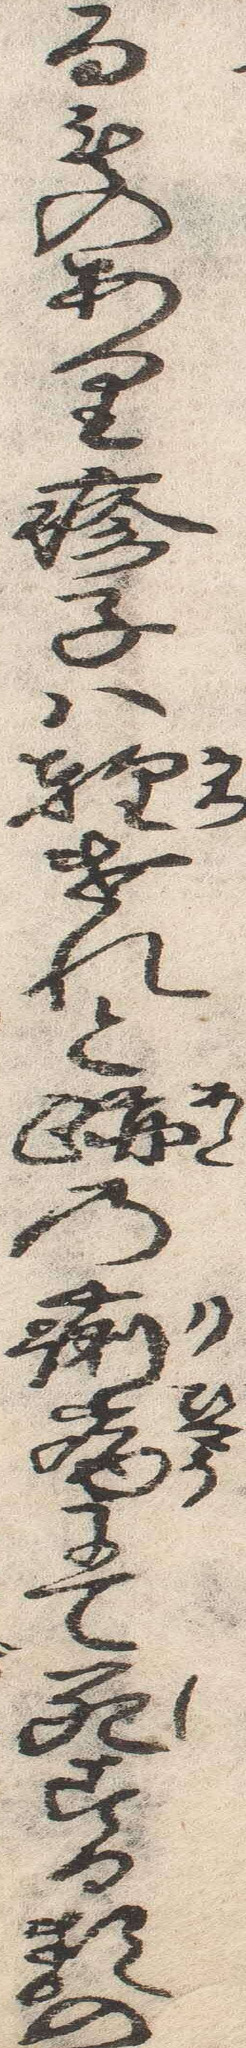るものあり疹子は軽けれと跡の痢病にて死する類の
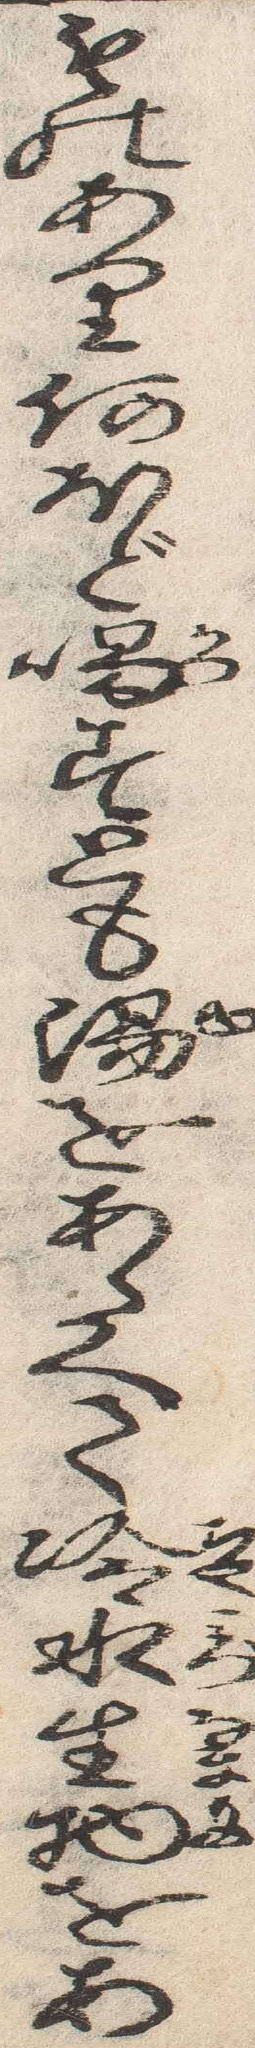ものあり何ほど喝すとも湯をあたへて冷水生物をあ
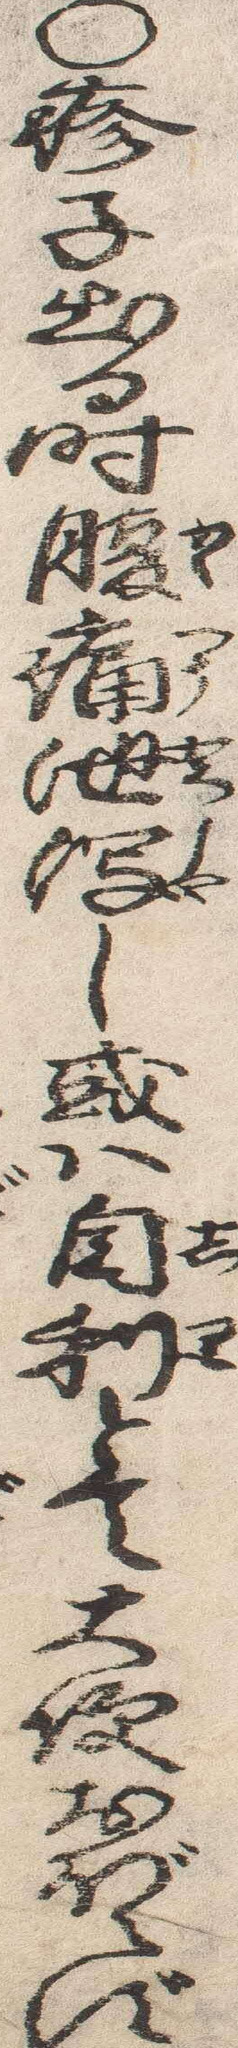○疹子出る時腹痛泄瀉し或は自利とて大便おぼえず
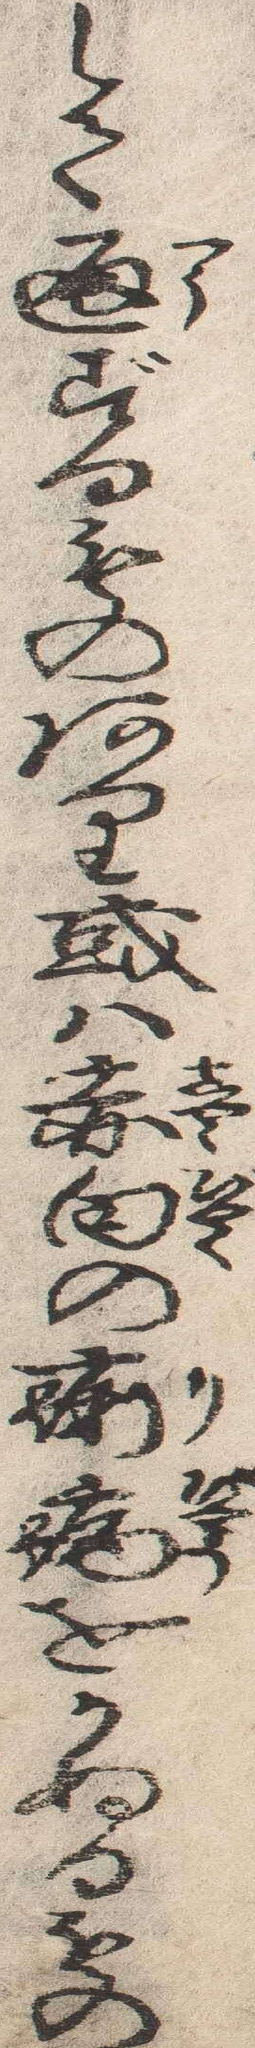して通ずるものあり或は赤白の痢病をかぬるもの
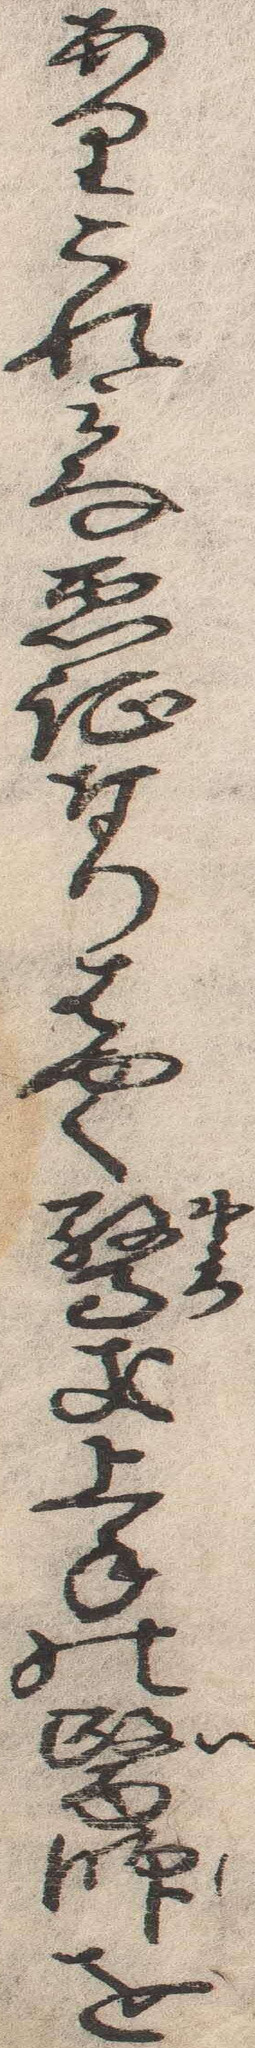ありこれみな悪証なりはやく驚き上手の医師を

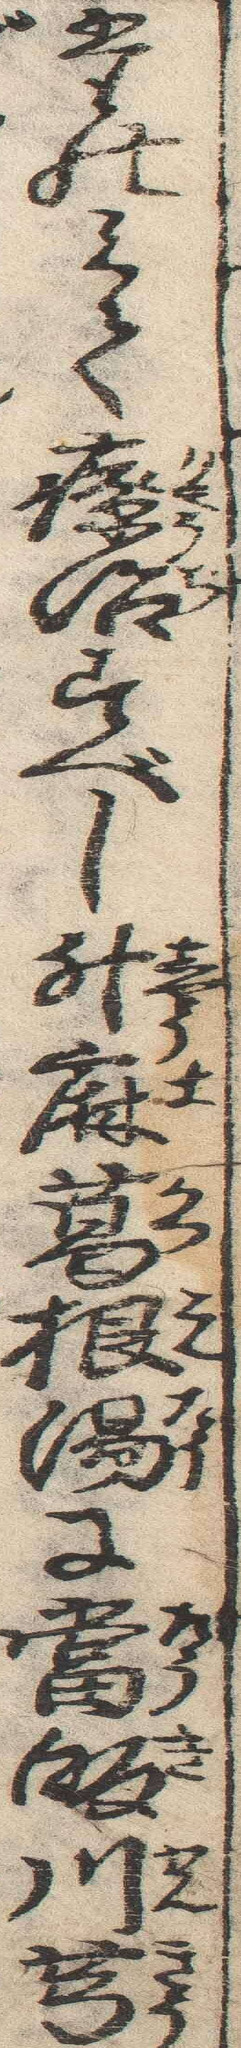たのみて療治すべし升麻葛根湯に当皈川芎
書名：小児必用養育草
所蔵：東京学芸大学附属図書館 国文学研究資料館
